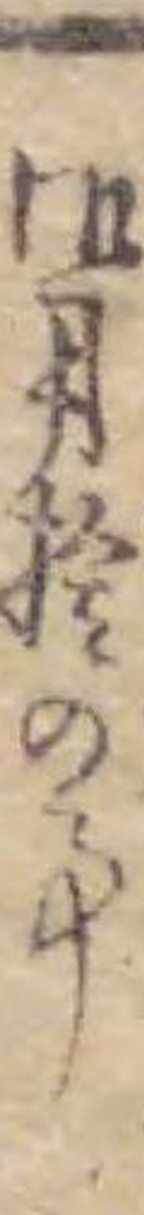御用捨の事
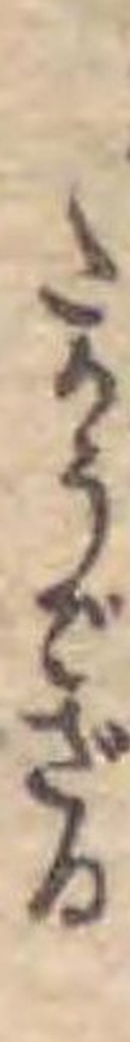たかうござる
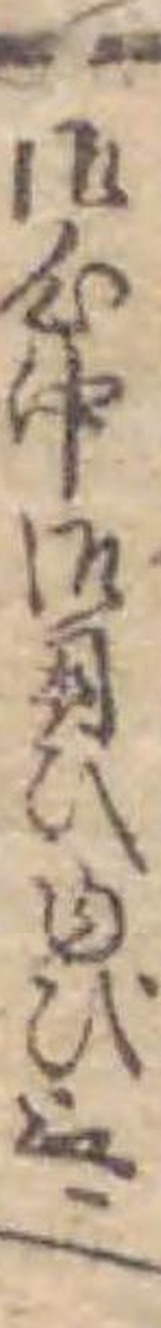御心中御用ひゆび無
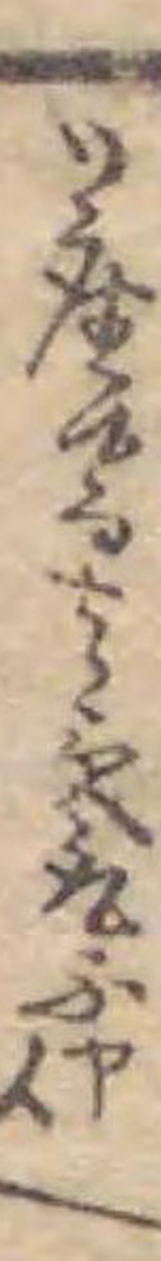御座候而其受取不申候
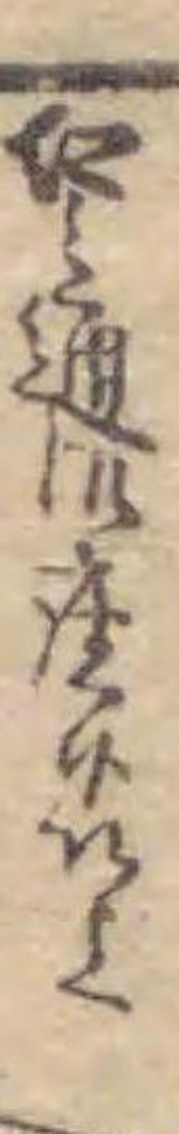右之通御座候以上
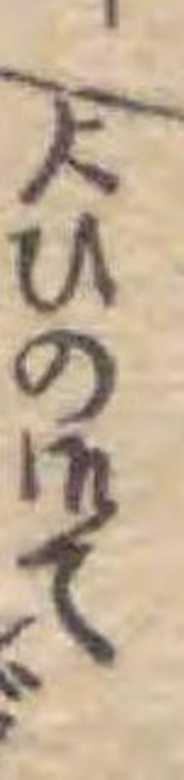大ひの御て
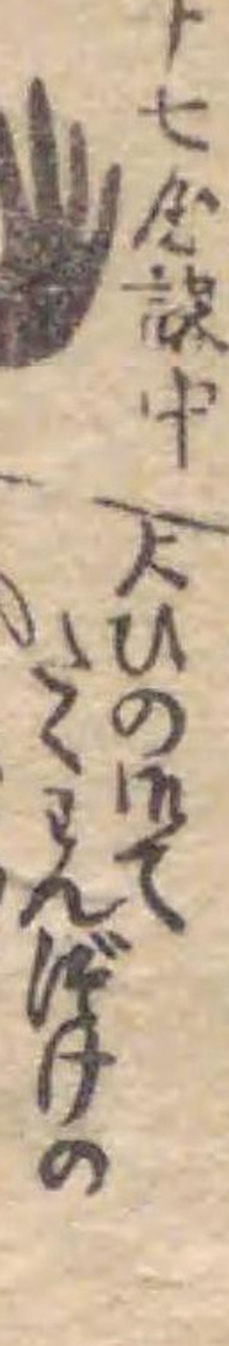たくわんづけの
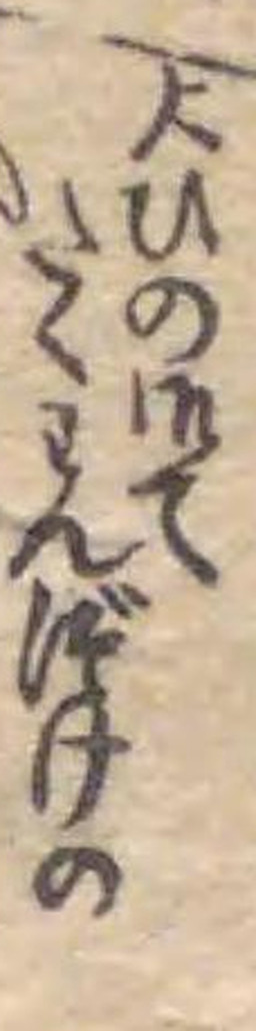たくわんづけの
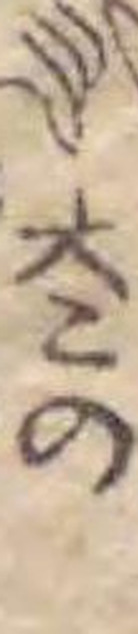大この
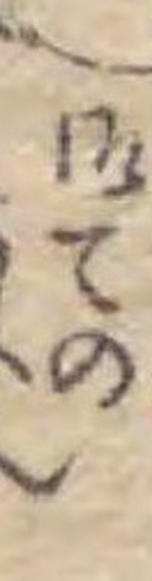御ての
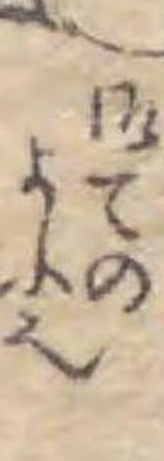よふ也
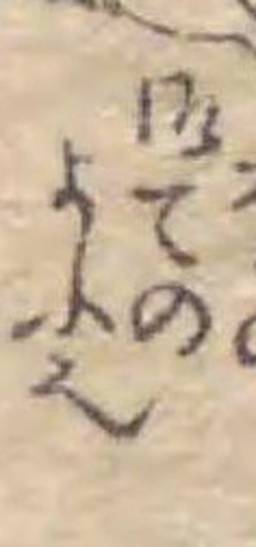よふ也
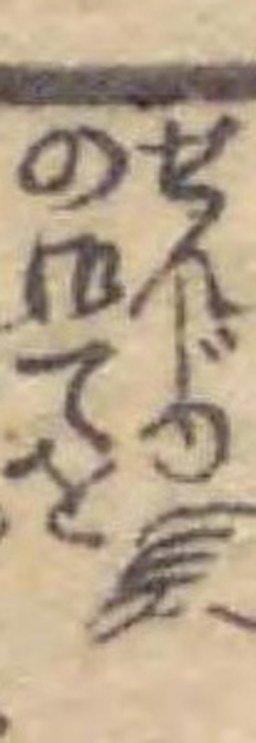の御てを
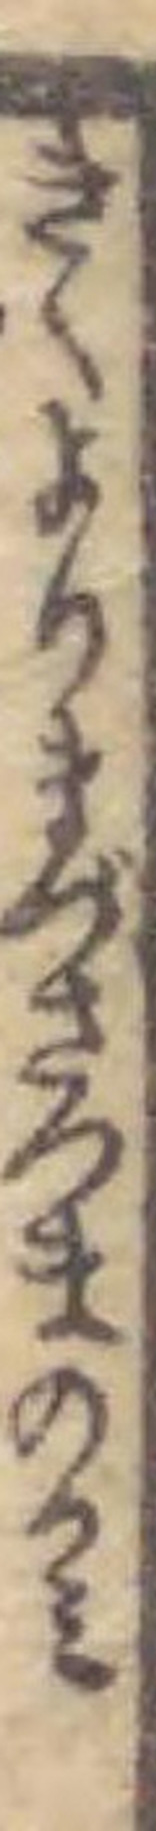きくよりまづさつまのかみ
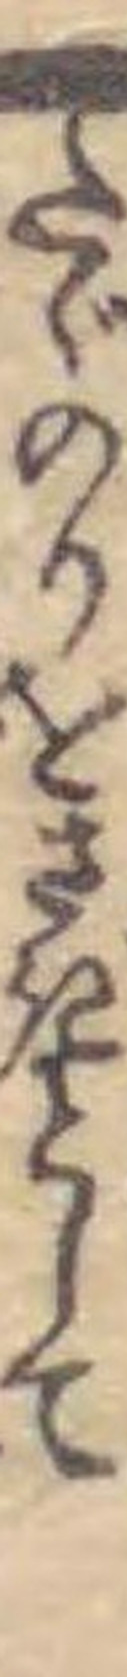たゞのりをさきをして
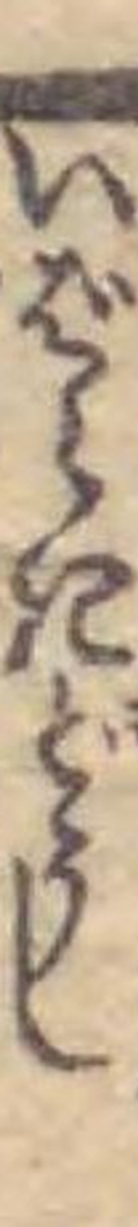いばらにどうし
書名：大悲の千六本 : 1巻
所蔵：国立国会図書館 National Diet Library, JAPAN
